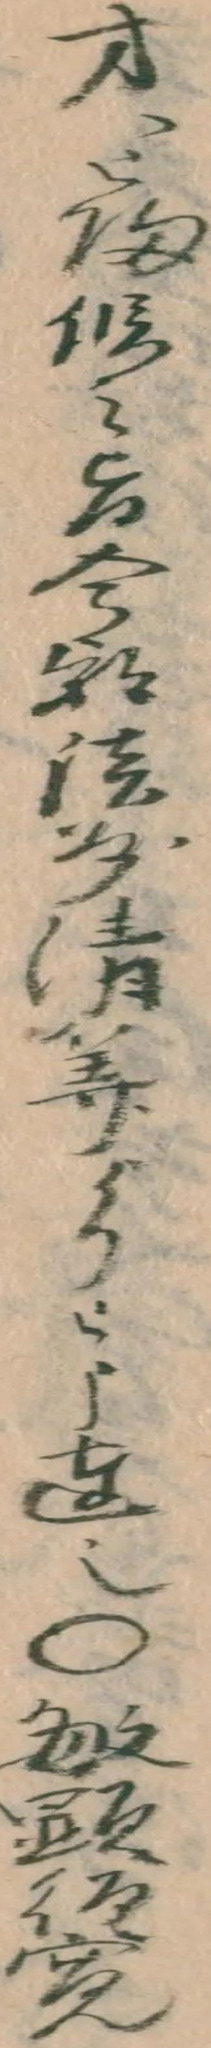方へ被帰候之旨今朝請多清算より被申達也○敏顕経寛
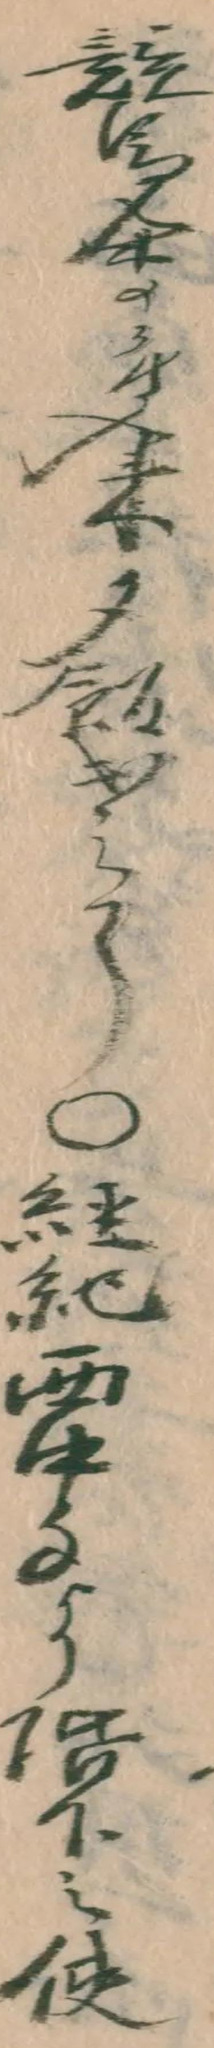競馬會ニ付入来夕飯出之了○経紀西中手より階下之使
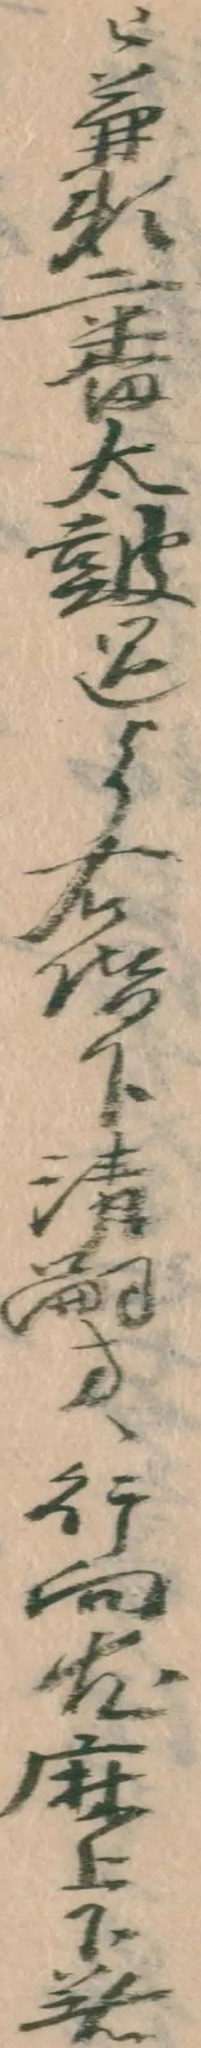被兼頼二番太皷過より右階下清嗣方へ行向尤麻上下新
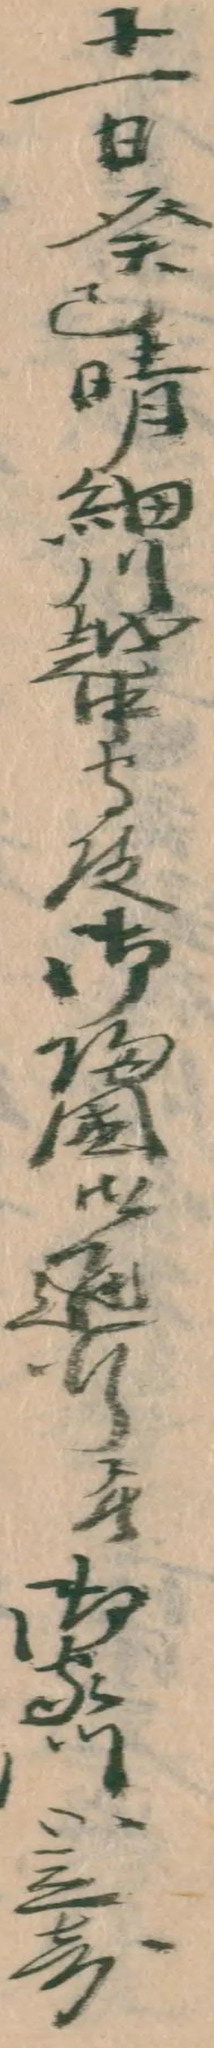十一日癸巳晴細川越中守殿御帰国御通行ニ付御家門御立寄
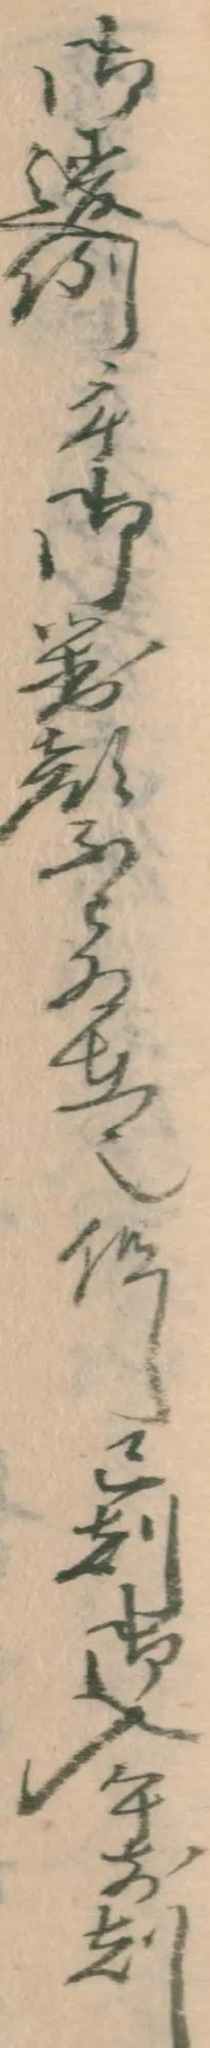御違例ニ付御對顔不被為在之但し巳刻御入午前刻
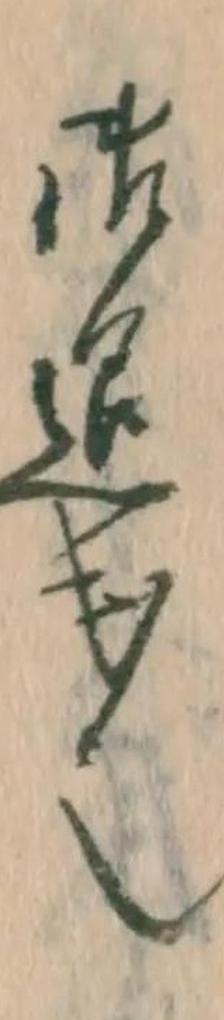御退出也
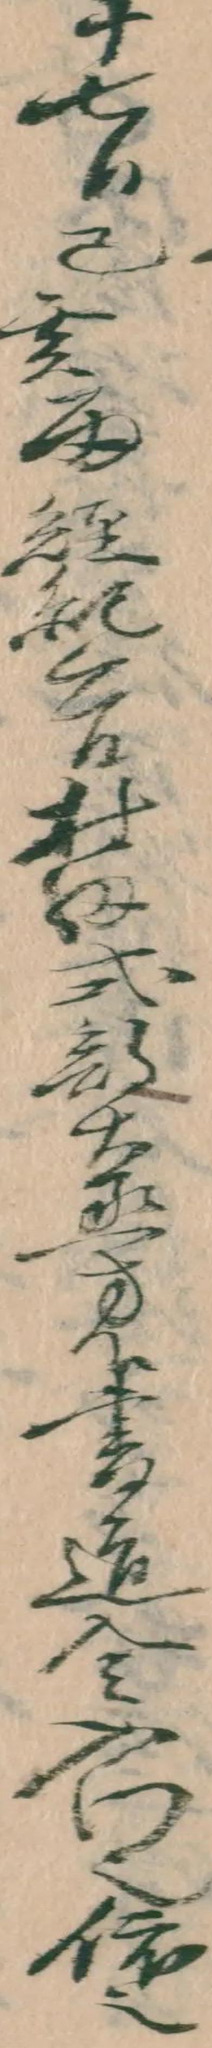十七日己亥雨経紀今日村田式部大丞方へ書道令入門也依之
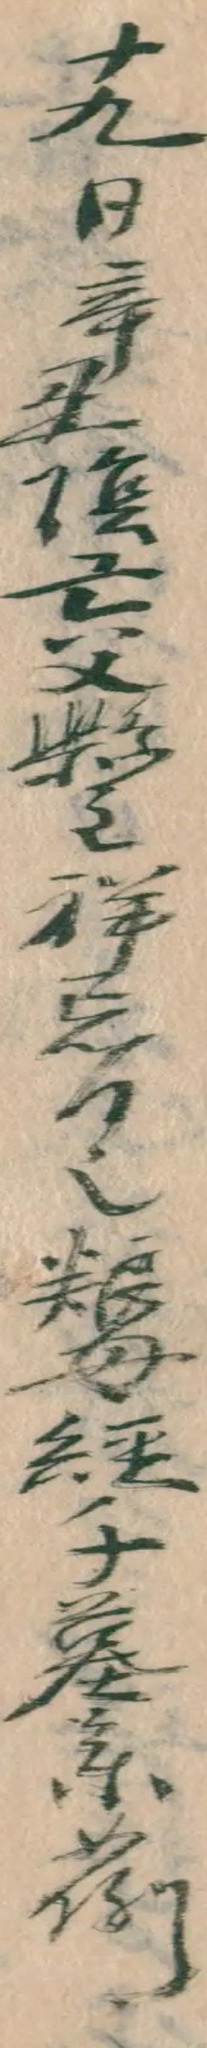十九日辛丑陰亡父縣主祥忌日也養母経千墓参如例也
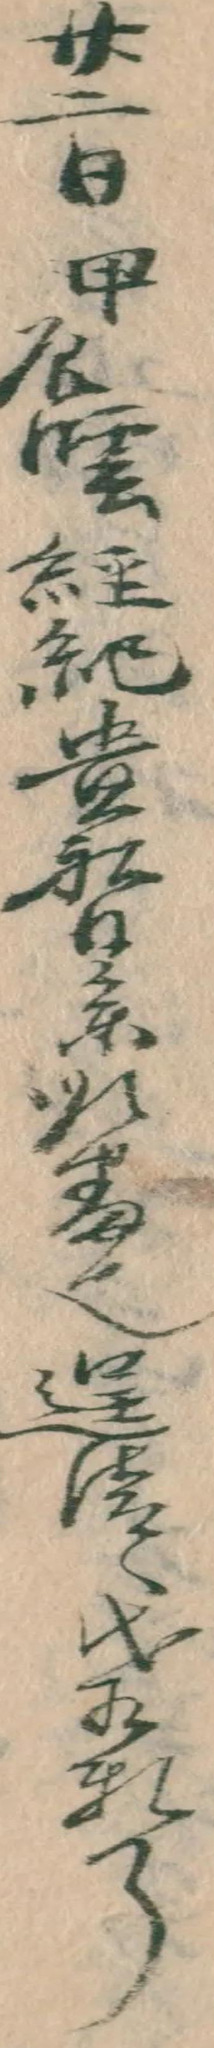廿二日甲辰経紀貴舩日参順番也逞清へ代相頼了
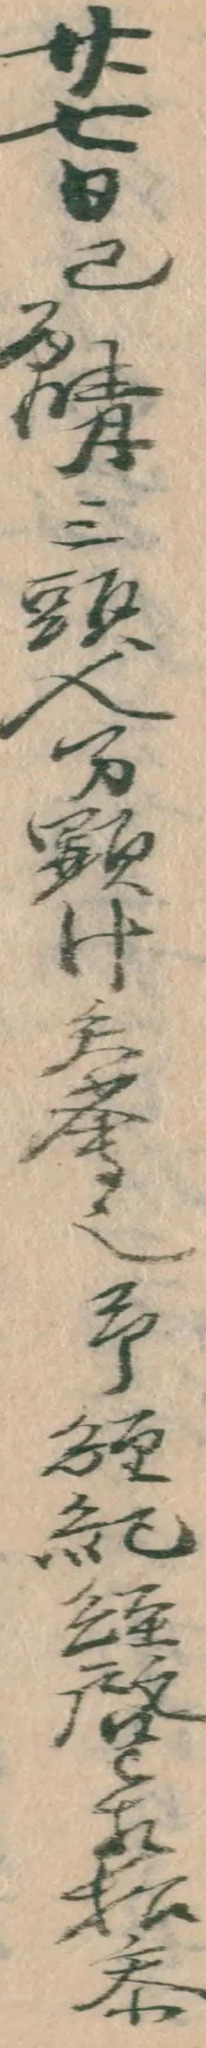廿七日己酉晴三頭人万顕汁参會也予経紀経啓被相招参
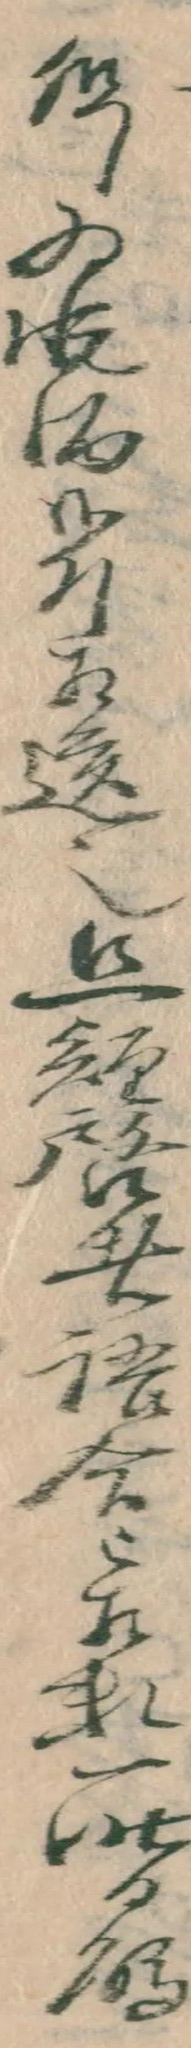但し為祝酒弐升相送也且経啓者語合被相頼一昨日觸
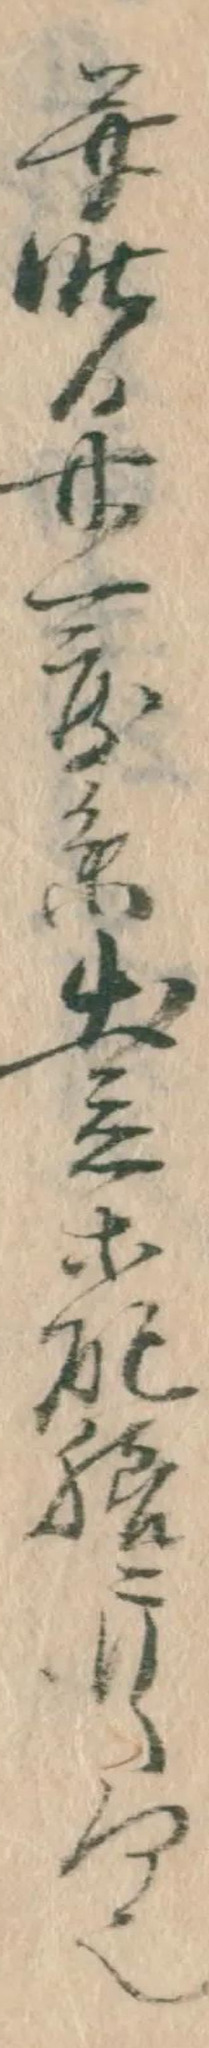并昨日廿一度参出立等配膳ニ行向也
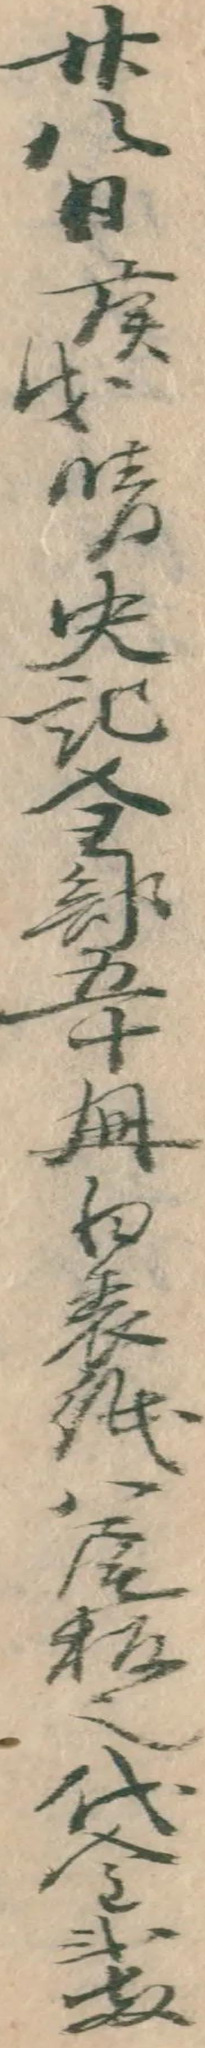廿八日庚戌晴史記全部五十冊白表紙八尾板也代金弐両
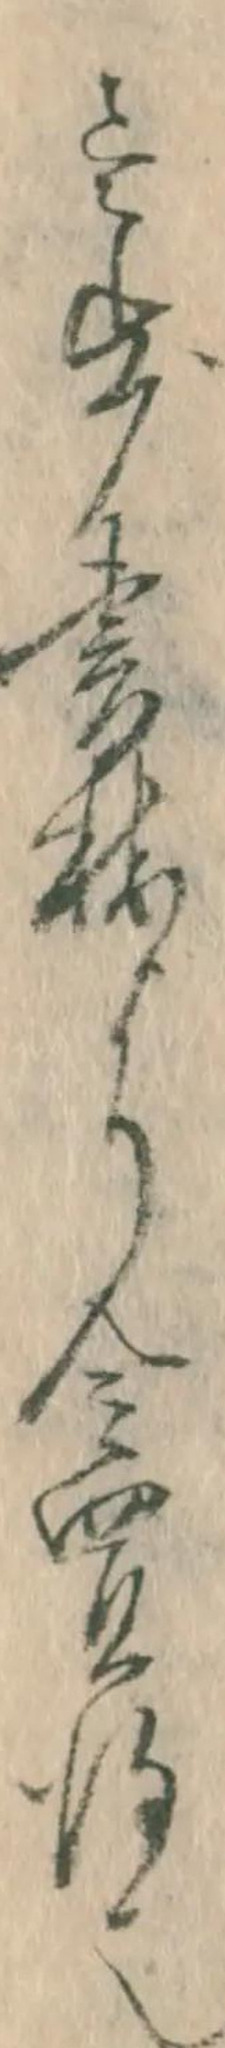壱歩書林より令買得也

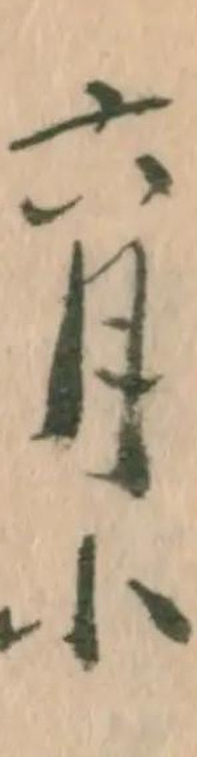六月小
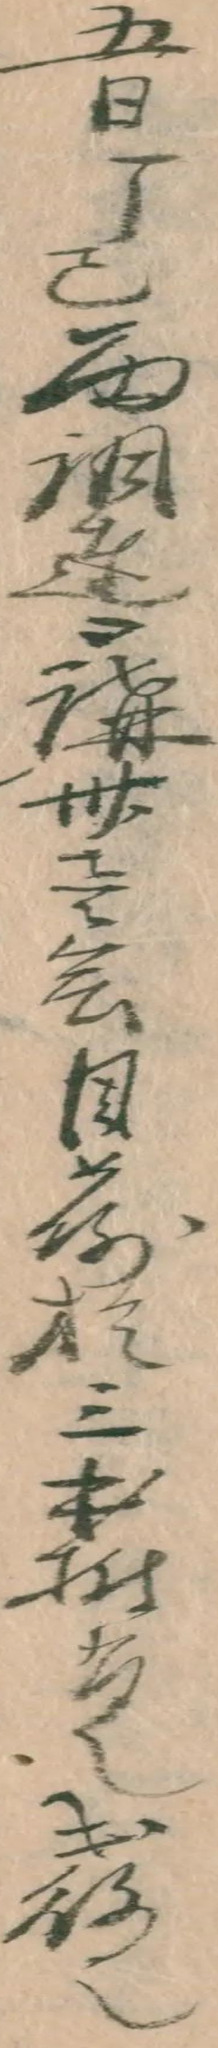五日丁巳雨調達御講卅壱會目如例於三本樹有之出役也
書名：賀茂社記録. 第67冊
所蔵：国立国会図書館 National Diet Library, JAPAN
